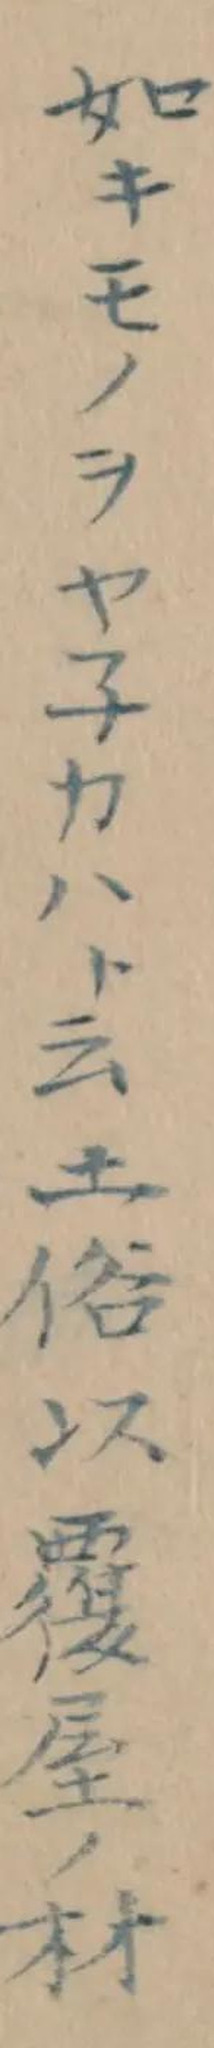如キモノヲヤネカハト云土俗以覆屋ノ材
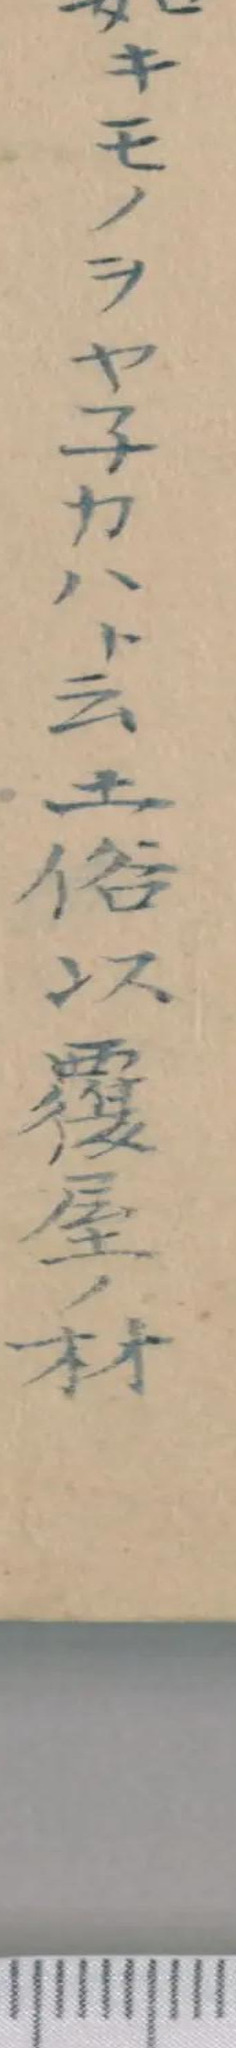如キモノヲヤネカハト云土俗以覆屋ノ材
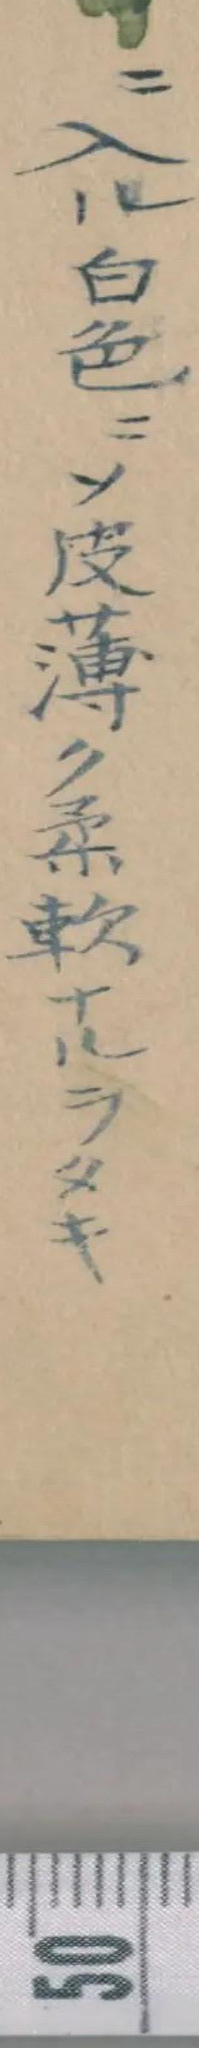入ル白色シテ皮薄ク柔軟ナルヲタキ
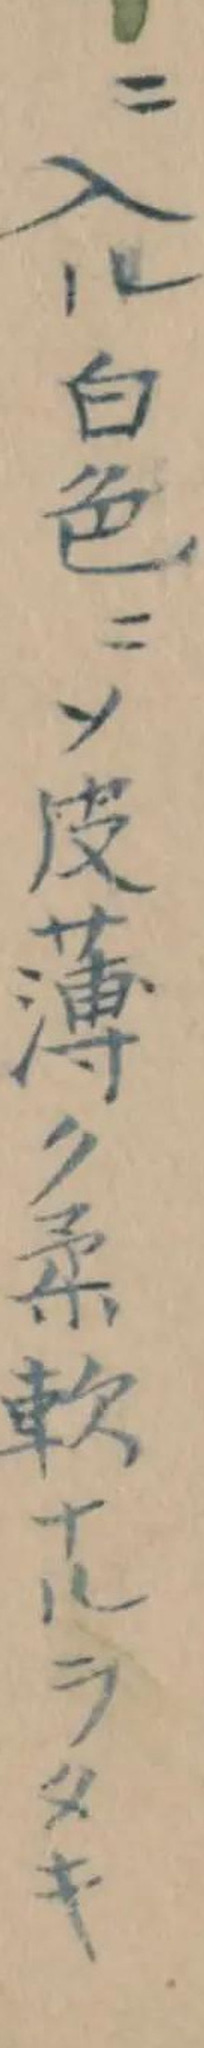入ル白色シテ皮薄ク柔軟ナルヲタキ
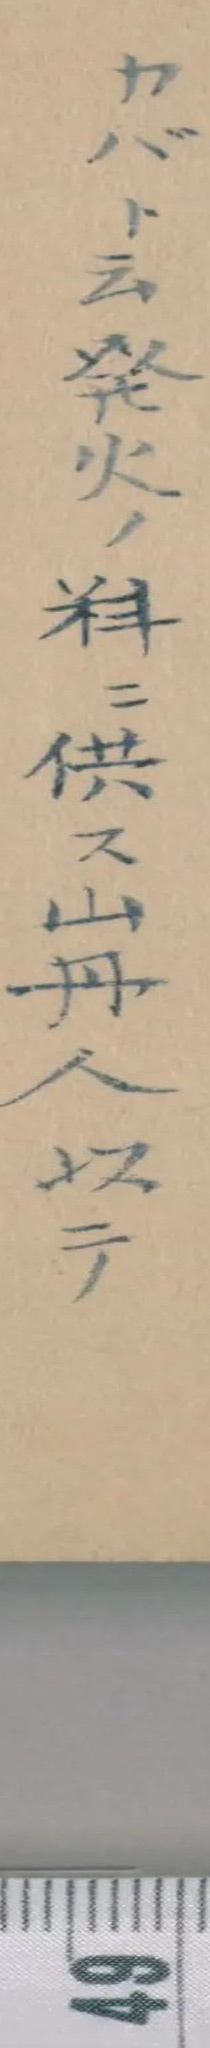カバト云発火ノ料供ス山丹人以テ
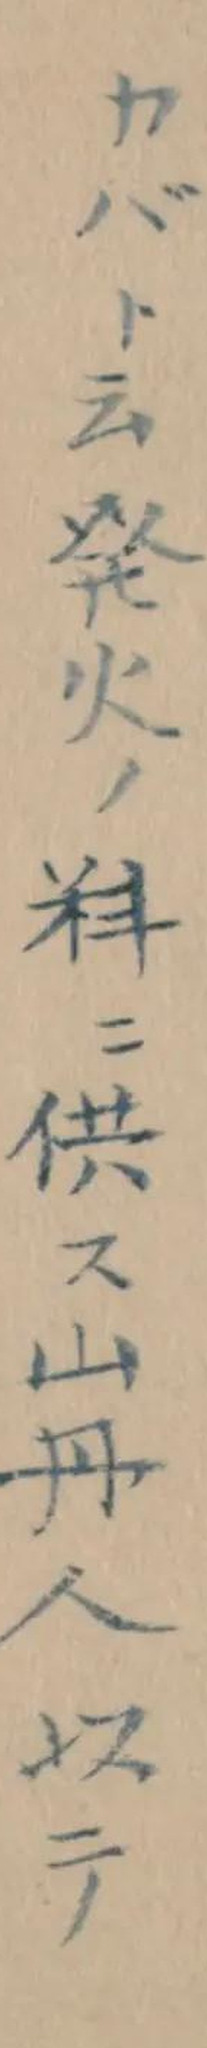カバト云発火ノ料供ス山丹人以テ
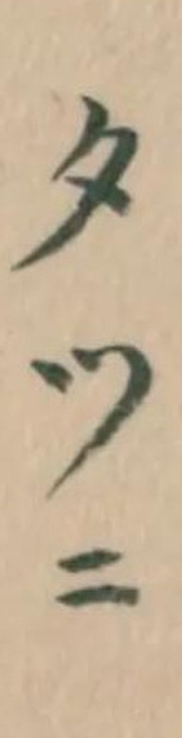タツニ
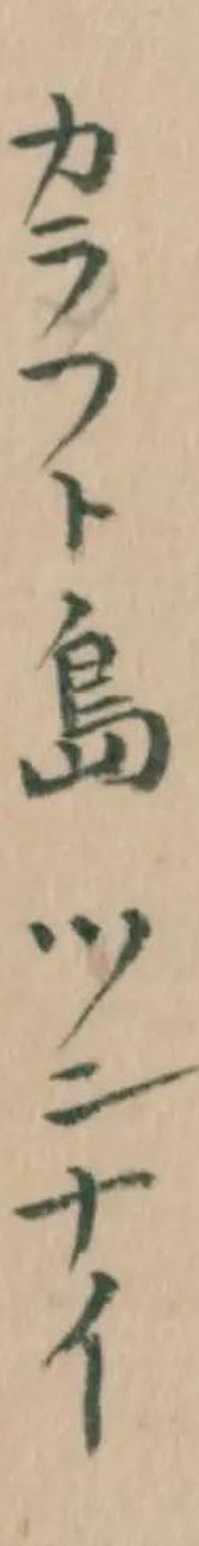カラフト島ツンナイ
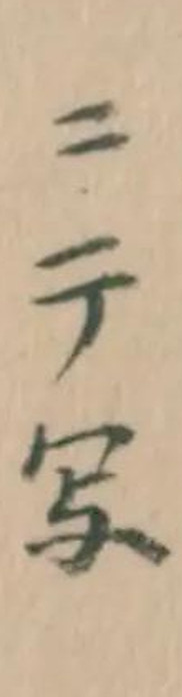ニテ写
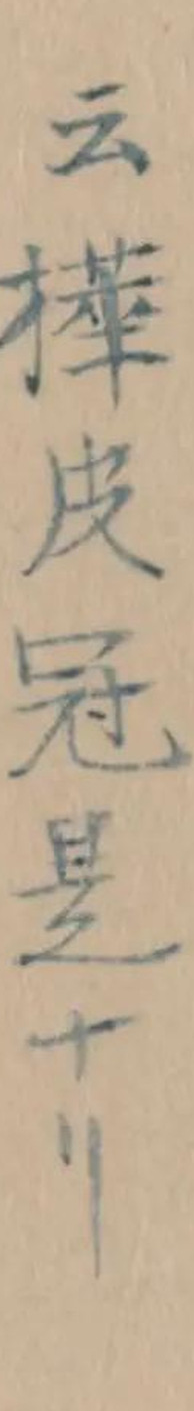云樺皮冠是ナリ
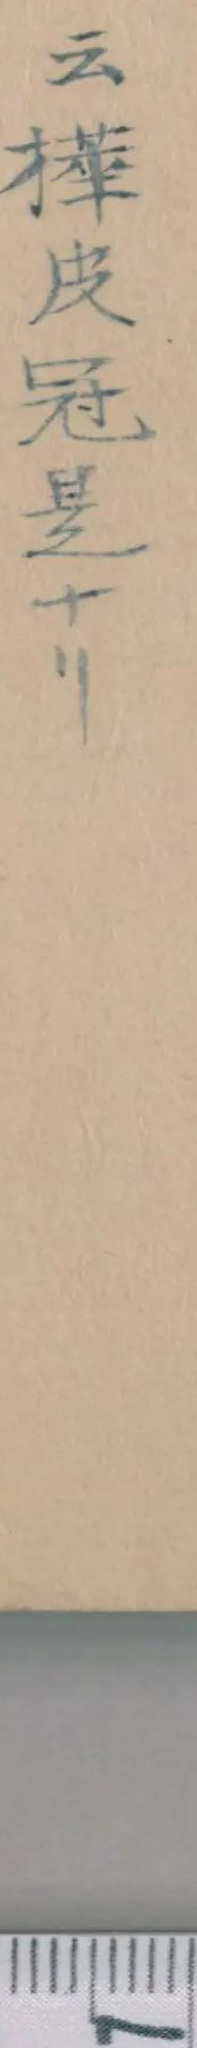云樺皮冠是ナリ

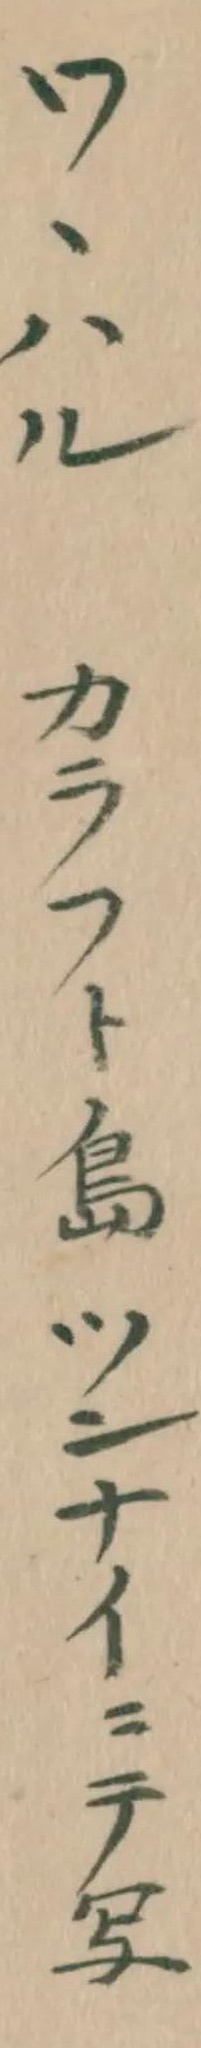ワヽハルカラフト島ツンナイニテ写
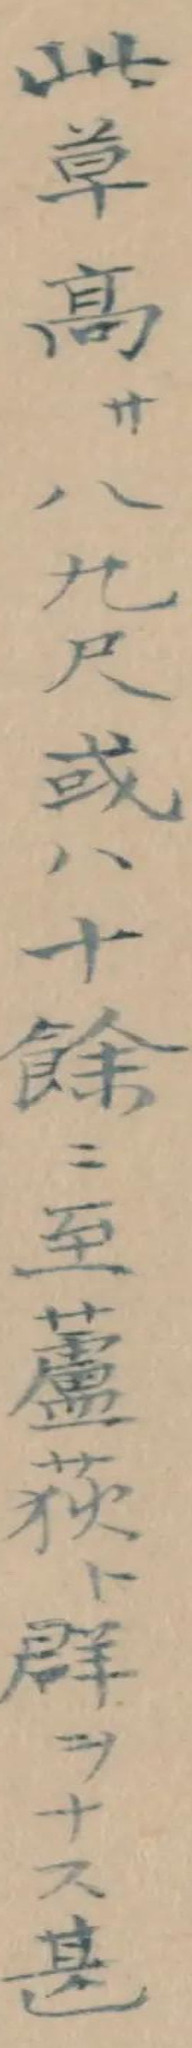此草高八九尺或ハ十余ニ至蘆荻ト群ヲナス甚
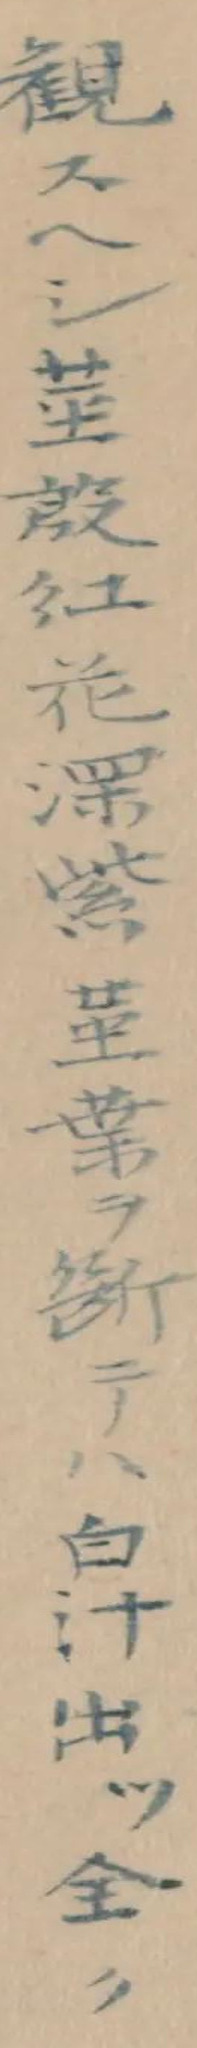観スヘシ茎殷紅花深紫茎葉ヲ断テハ白汁出ツ全ク

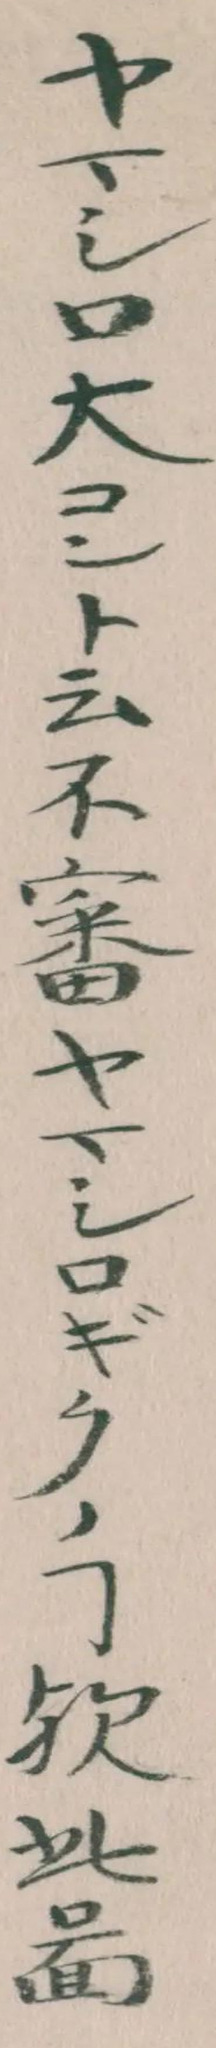ヤマシロ大コント云不審ヤマシロギクノヿ欤此図
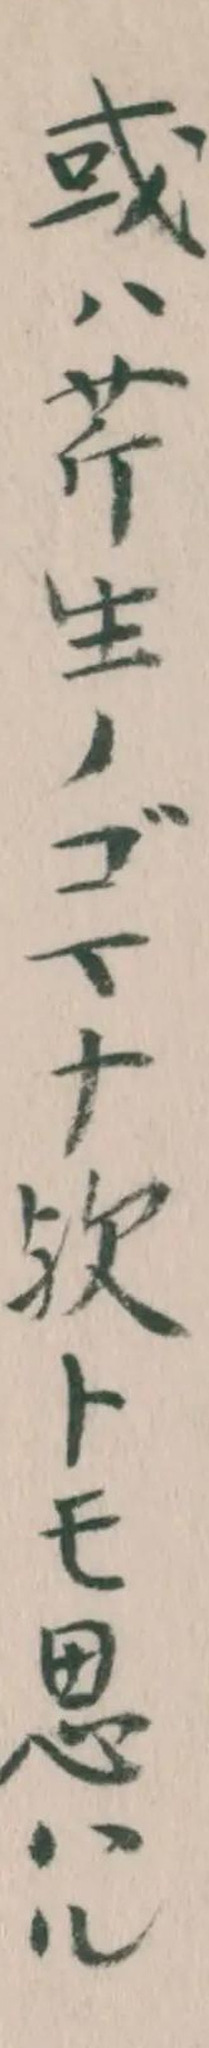或ハ芹生ノゴマナ欤トモ思ハル
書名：蝦夷草木図
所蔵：国立国会図書館 National Diet Library, JAPAN
